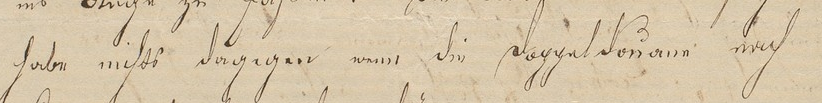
habe nichts dagegen wenn die Doppeldouane nach
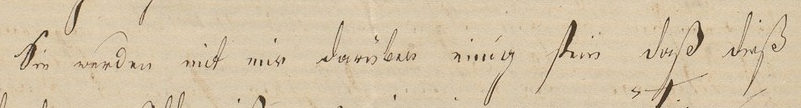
Sie werden mit mir darüber einig sein daß dieß
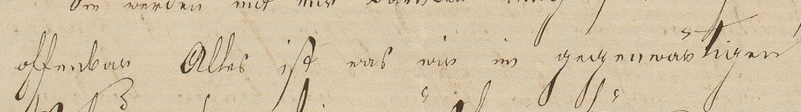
offenbar Alles ist was wir im gegenwärtigen
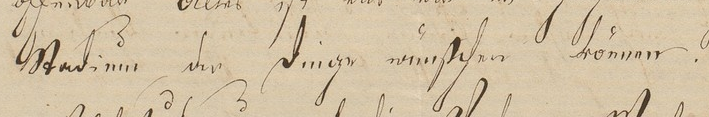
Stadium der Dinge wünschen können.
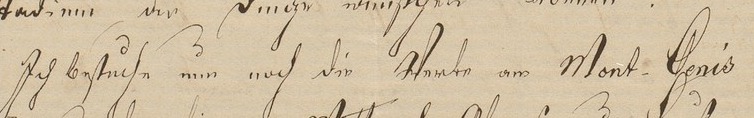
Ich besuche nun noch die Werke am Mont-Cenis
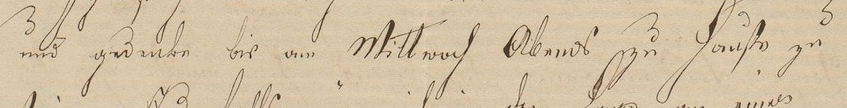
und gedenke bis am Mittwoch Abend zu Hause zu
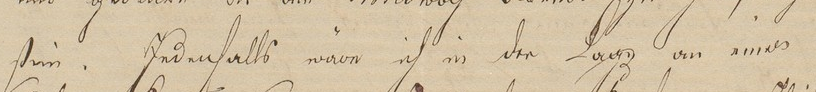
sein. Jedenfalls wäre ich in der Lage an einer
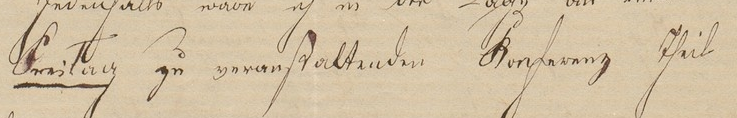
Freitag zu veranstaltenden Konferenz Theil
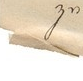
nehmen.
